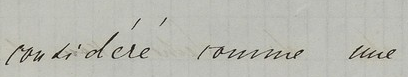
considéré comme une
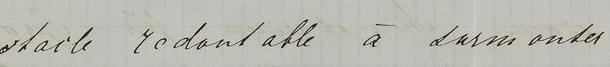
stacle redoutable à surmonter,
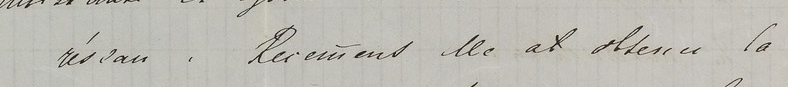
réseau. Recemment elle a obtenu la
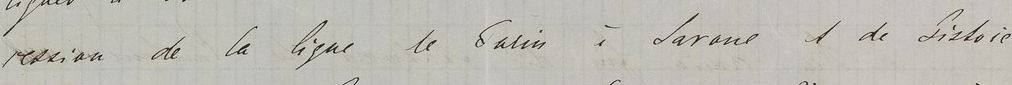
cession de la ligne de Turin à Savone et de Pistoie
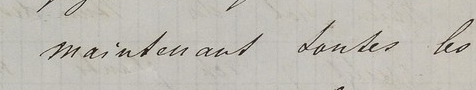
maintenant toutes les
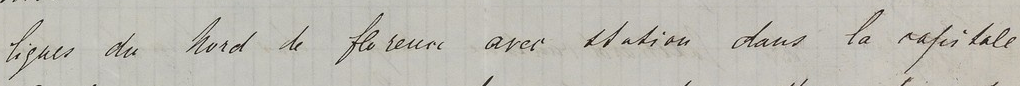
lignes du Nord de Florence avec station dans la capitale.
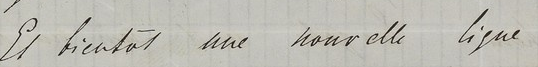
Et bientôt une nouvelle ligne
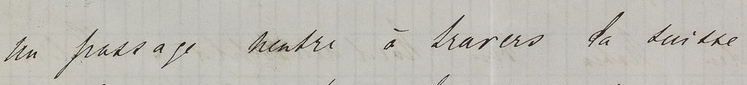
un passage neutre à travers la suisse est
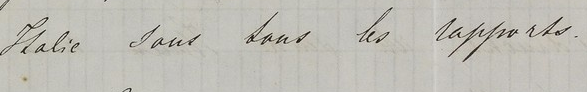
Italie sous tous les rapports.»
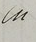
Gestern
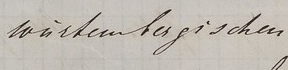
würtembergischen
